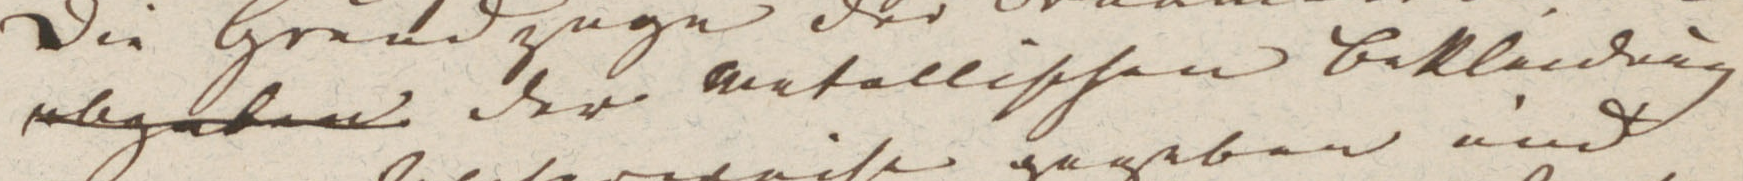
abgaben der metallischen Bekleidung
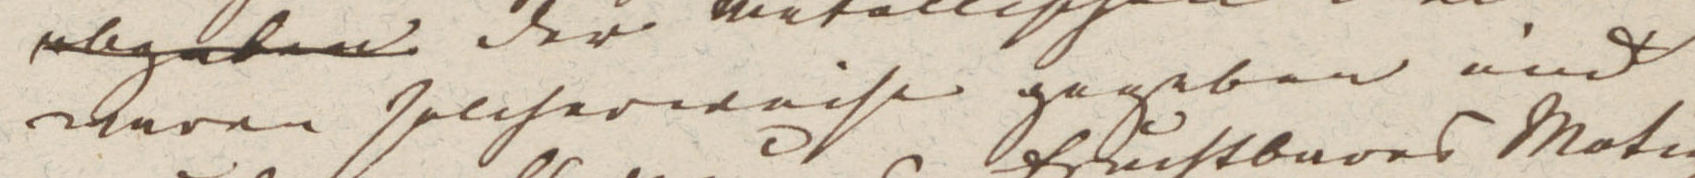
waren solcherweise gegeben und
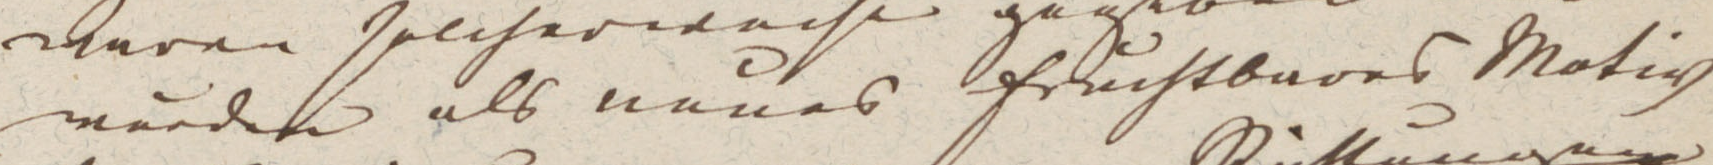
wurden als neues fruchtbares Motiv
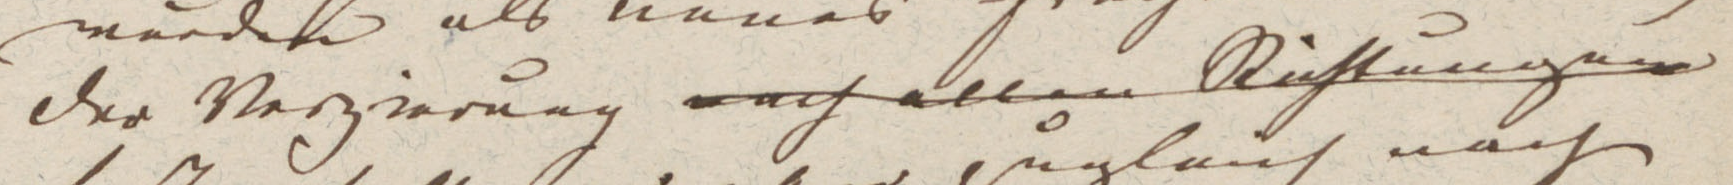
der Verzierung nach allen Richtungen
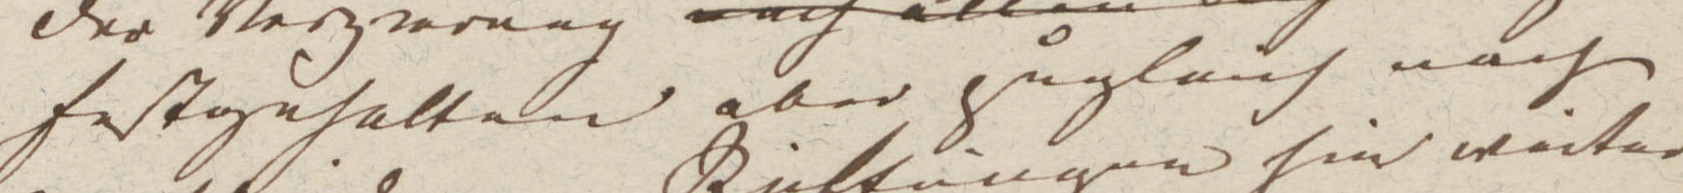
festgehalten aber zugleich nach
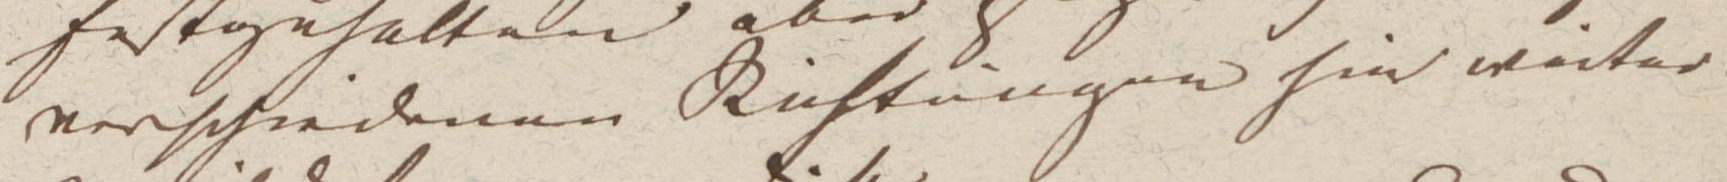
verschiedenen Richtungen hin weiter-
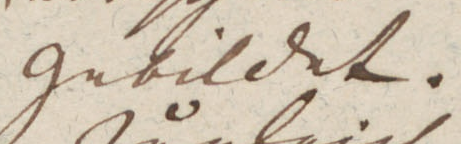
gebildet.
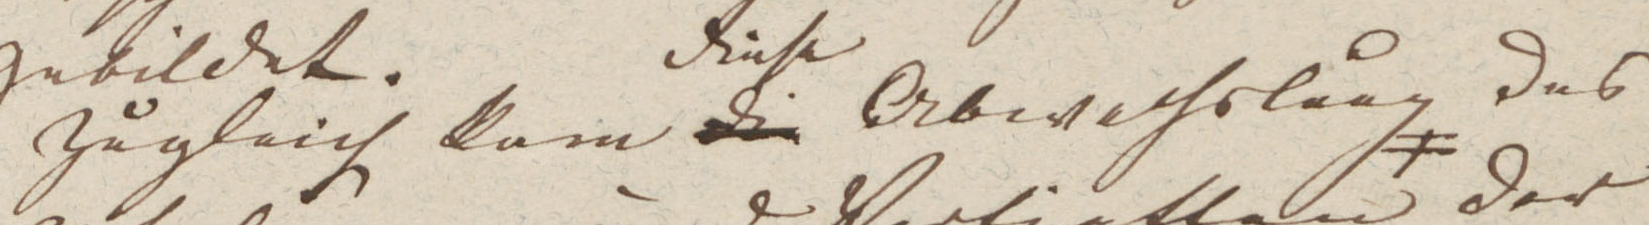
Zugleich kam die diese Abwechlsung des
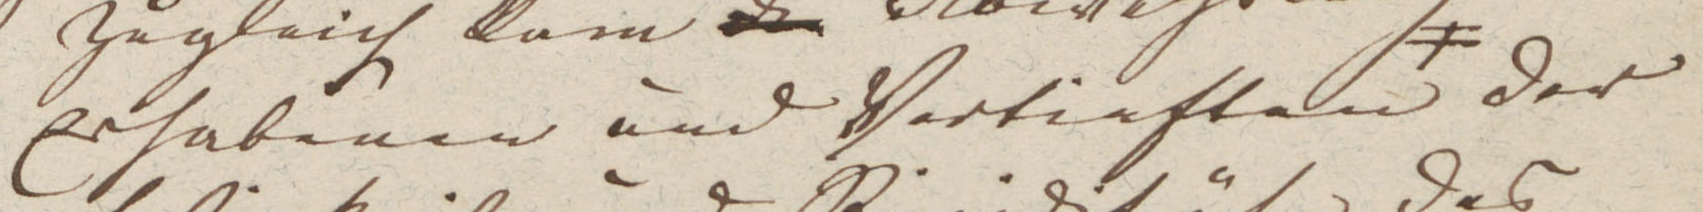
Erhabenen und Vertieften % der
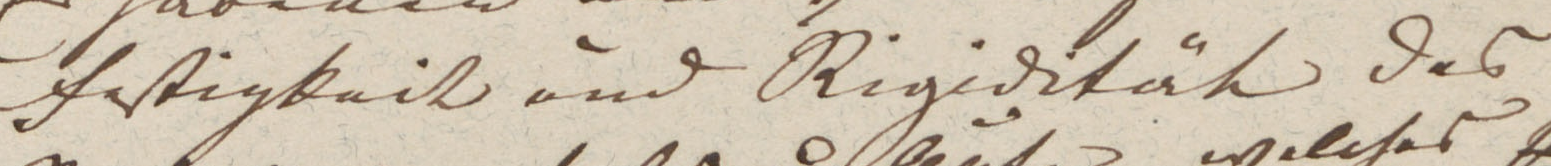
Festigkeit und Rigidität des
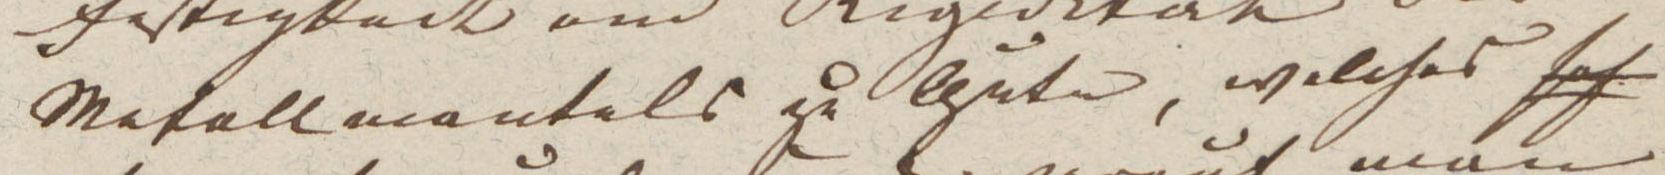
Metallmantels zu Gute, welches sof
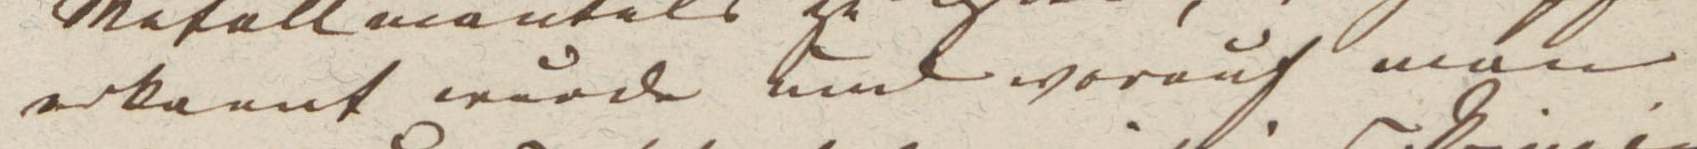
erkannt wurde und worauf man
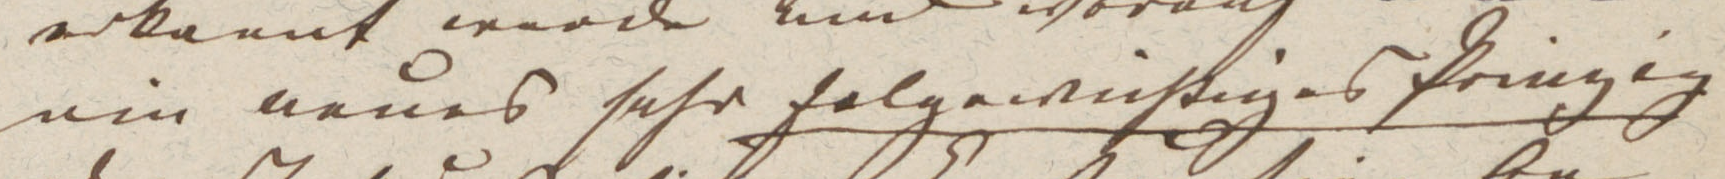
ein neues sehr folgewichtiges Prinzip
